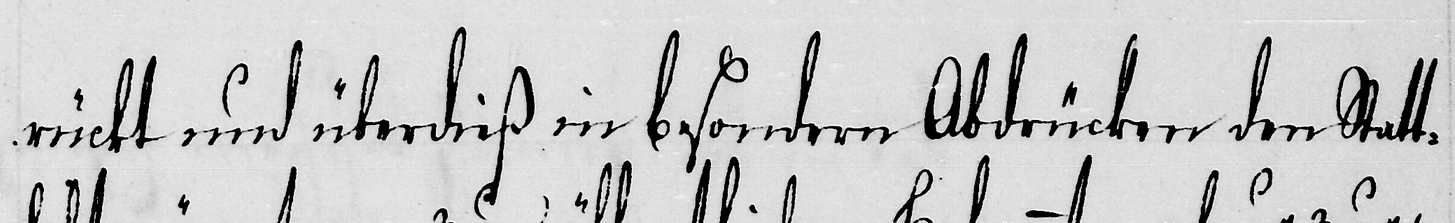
rückt und überdieß in besondern Abdrücken den Stat¬
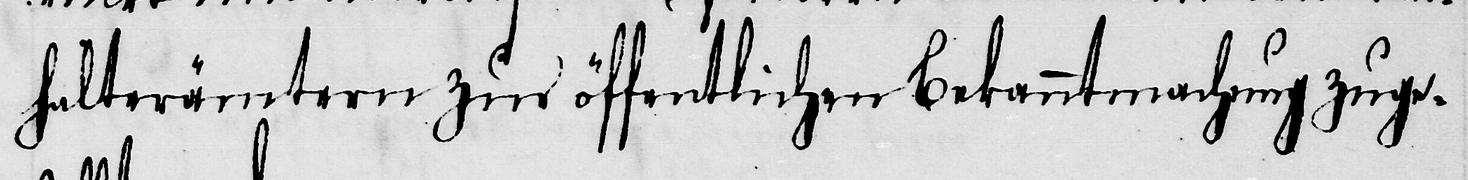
thalterämtern zur öffentlichen Bekanntmachung zuges¬
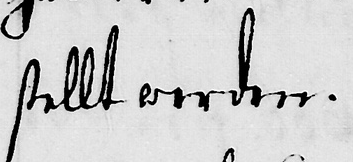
tellt werden.
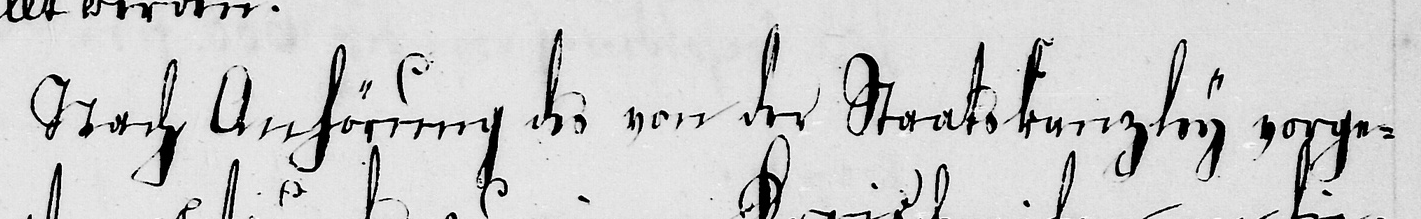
Nach Anhörung des von der Staatskanzley vorge¬
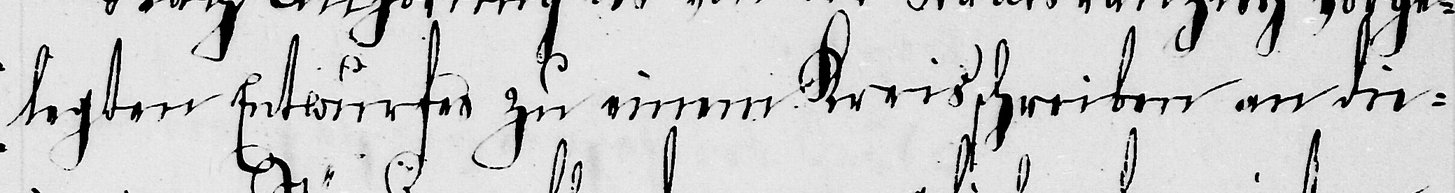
legten Entwurfes zu einem Kreisschreiben an dieje¬
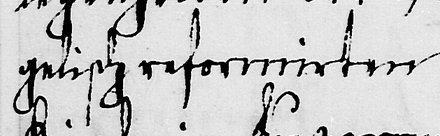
ngelisch reformirten
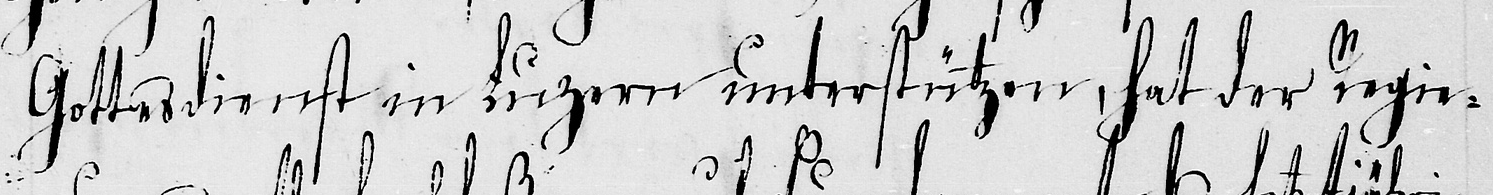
Gottesdienst in Luzern unterstützen, hat der Regie¬
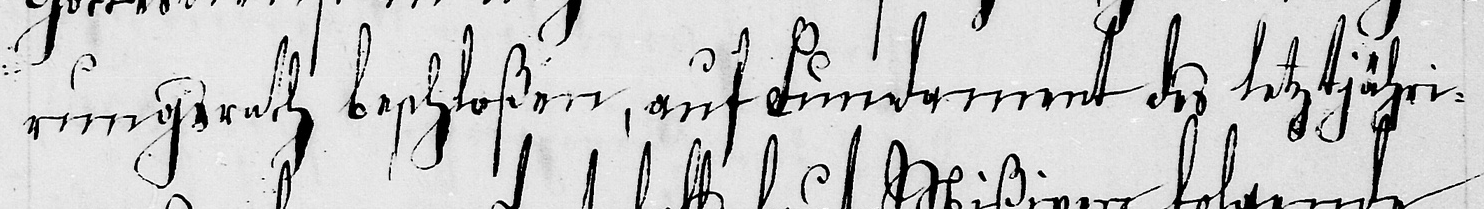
rungsrath beschloßen, auf Fundament des letztjähri¬
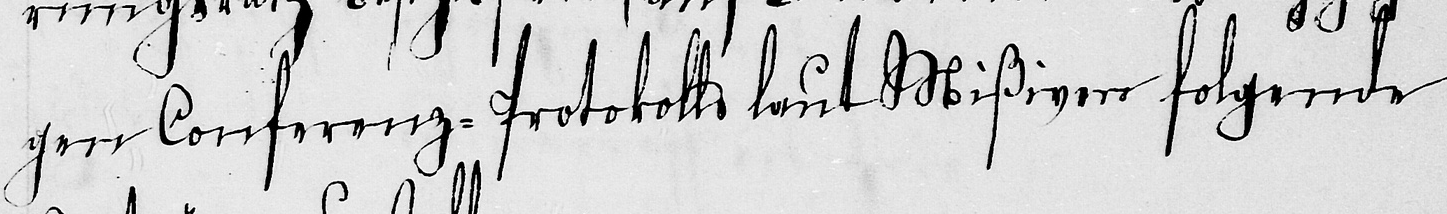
gen Conferenz-Protokolls laut Mißiven folgende
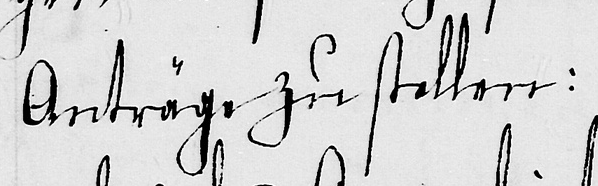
Anträge zu stellen:
